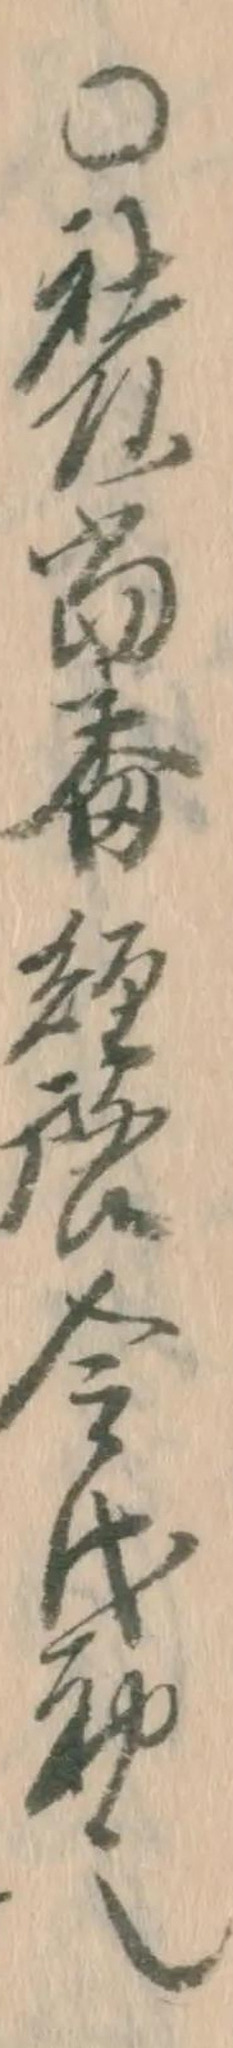○社頭當番経啓令代勤也
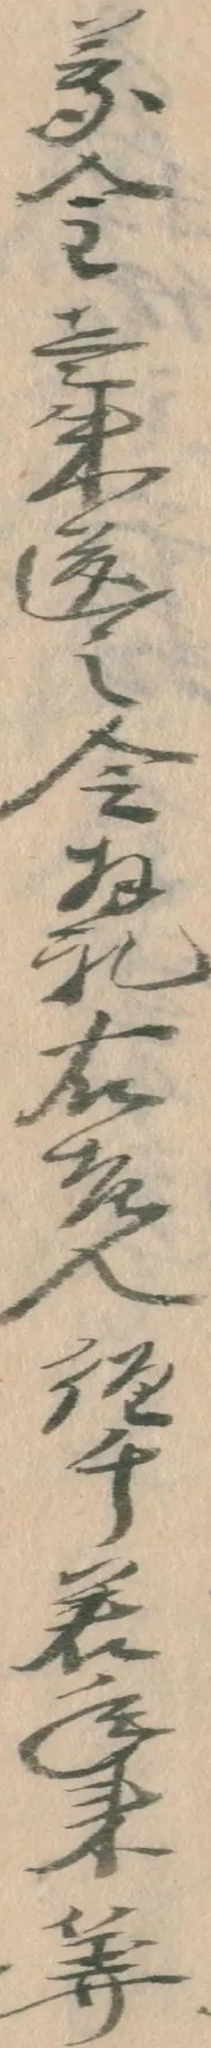奠金壱朱送之令拝礼右老人絶千若年来算
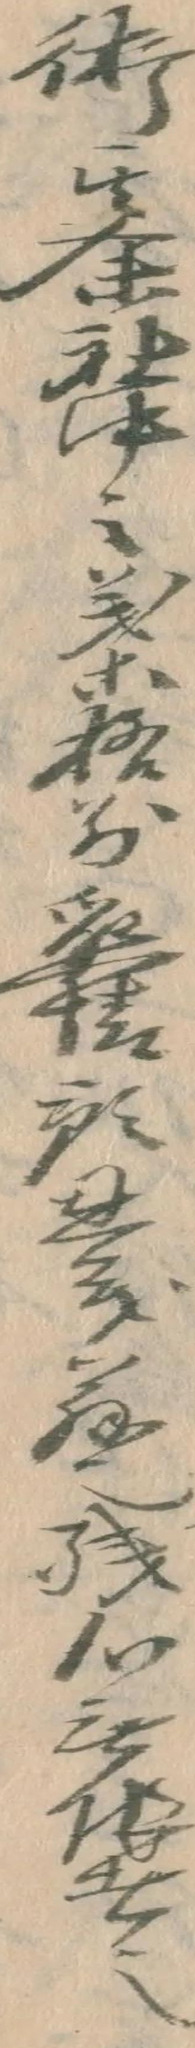術其余社中之義等格別懇情預恩義翁也残心無限者也
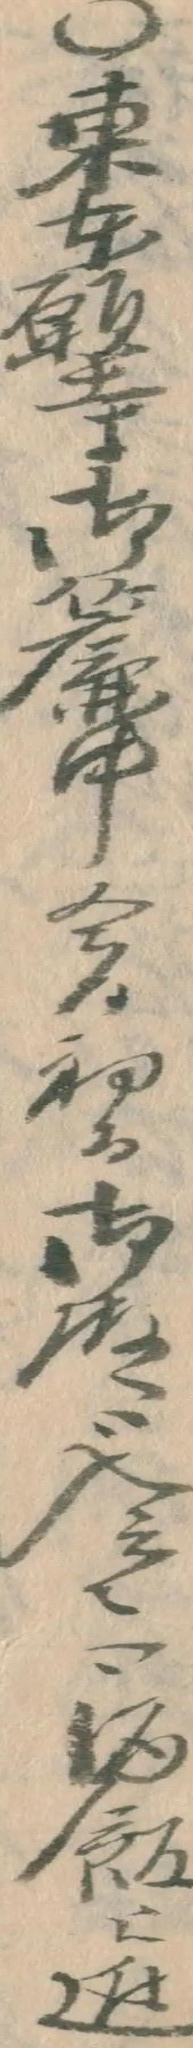○東本願寺御簾中今日初而御殿へ御入云々御酒飯被進
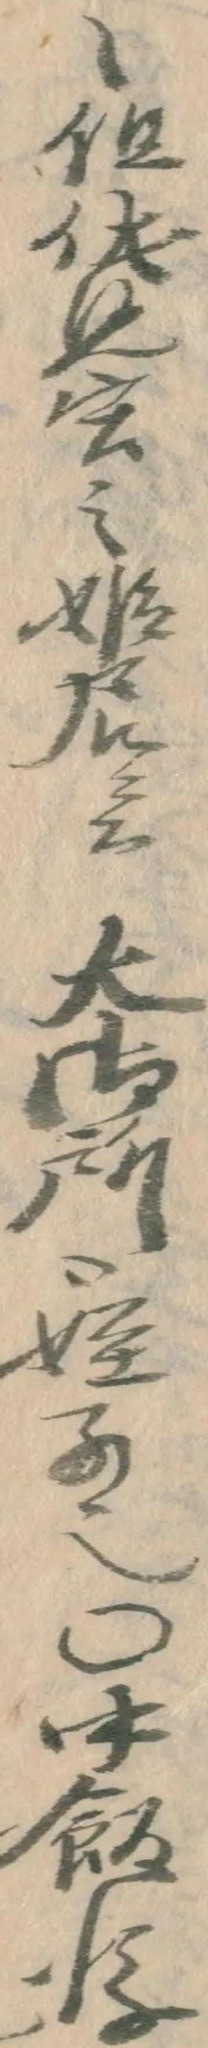之但伏見容之姫君ニ而大御所御姪子也○中飯後
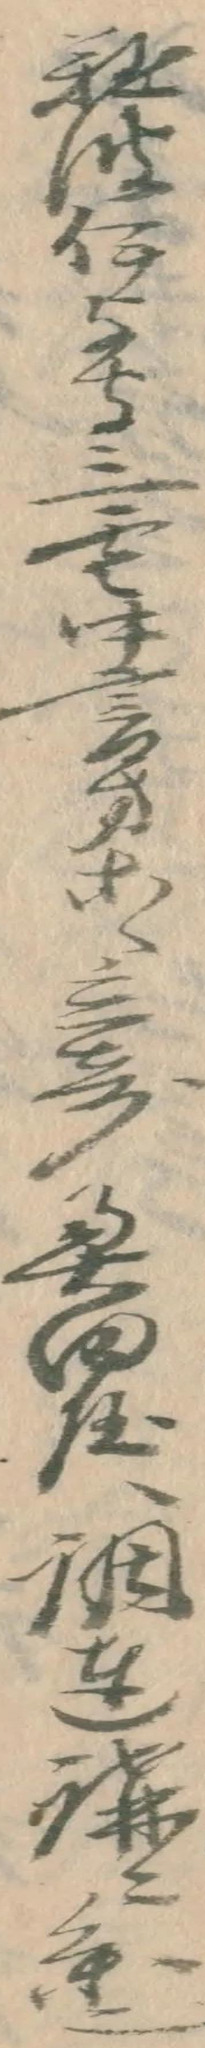難波伊与守三重中書方等へ立寄奥田屋へ調達講ニ参也
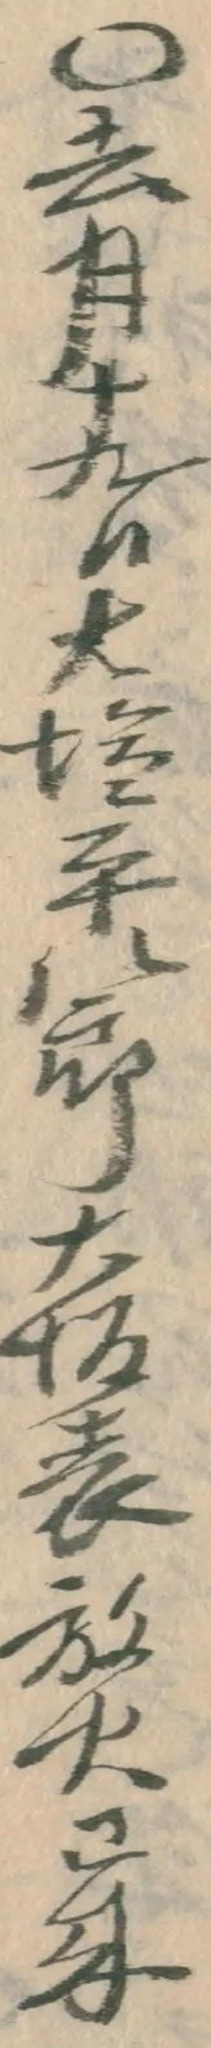○去月十九日大塩平八郎大坂表放火已来
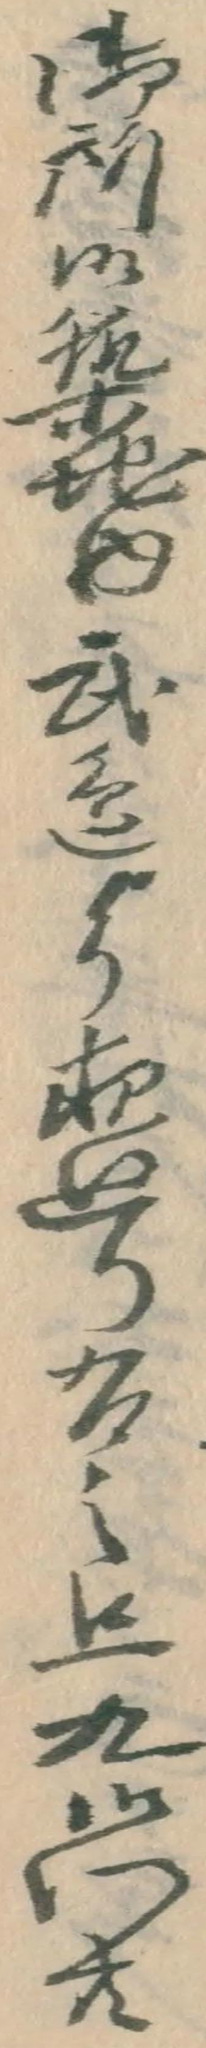御所御築地内武邊より夜廻り有之上九御門共

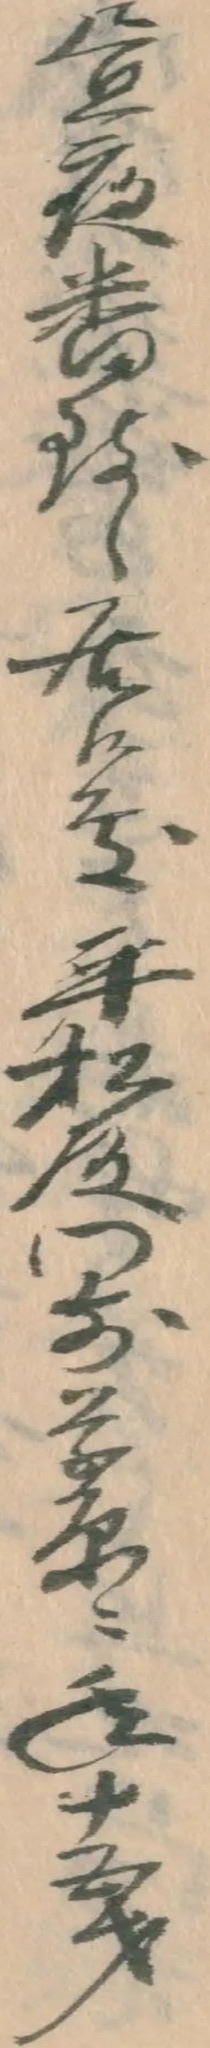昼夜番致し居候處平松殿門前草原ニ年十五才
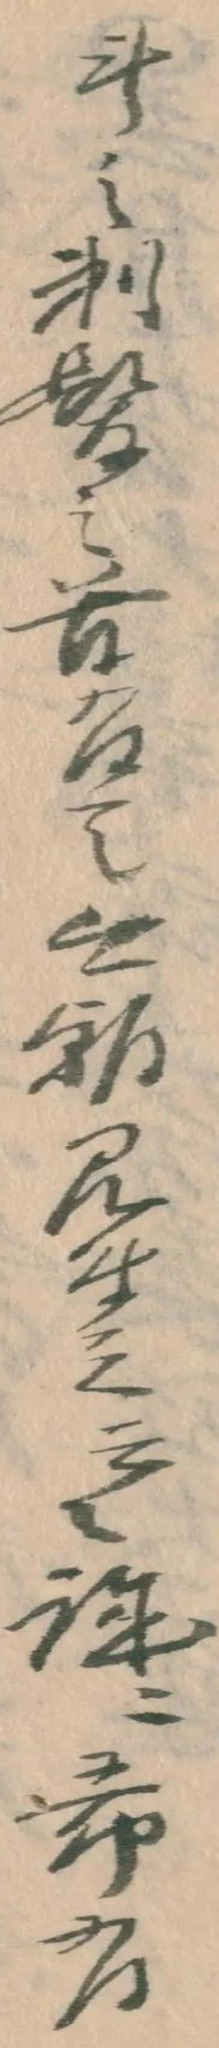斗之剃髪之首有之今朝見付之云々誠二希有
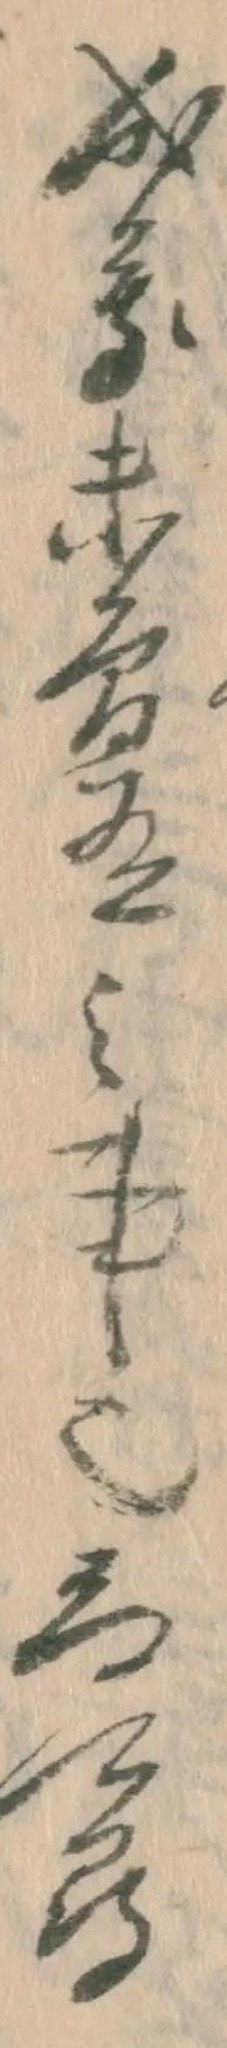成義未曽有之事也尚可尋
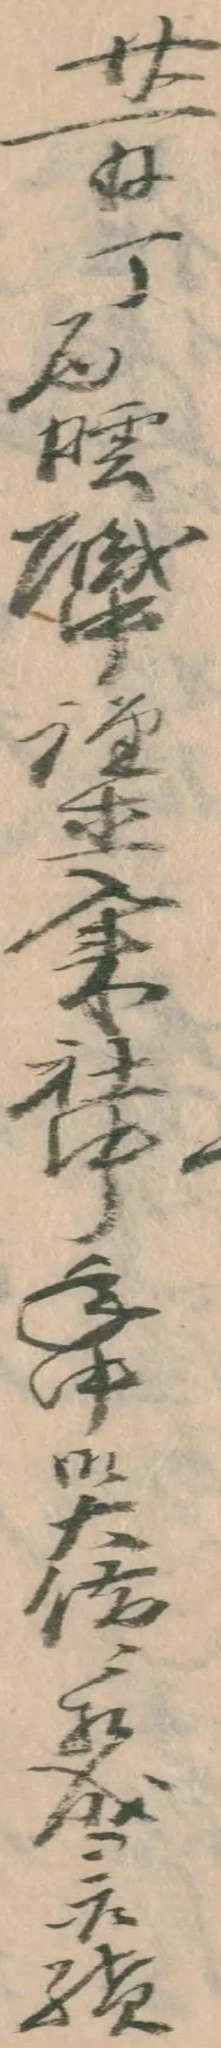廿一日丁酉曇職中謹直入来社中年中御大借に相成御取續
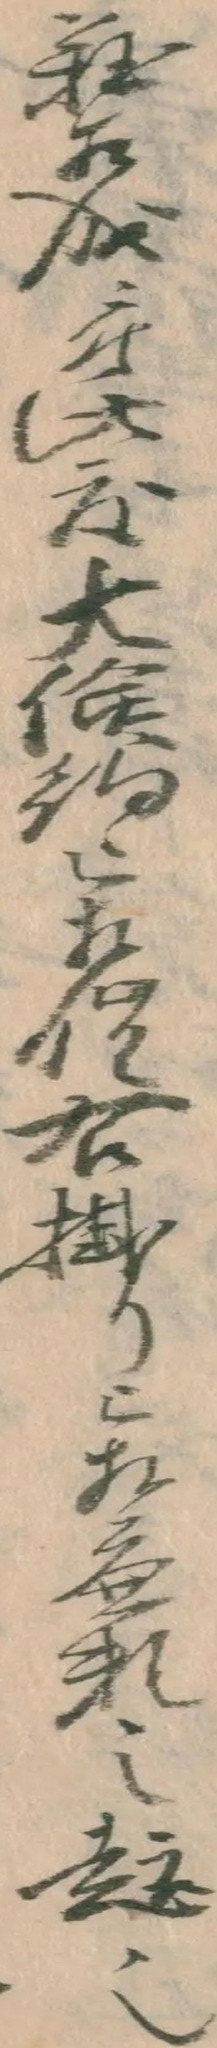難相成ニ付此度大倹約被相催右掛り被相兼頼之趣也
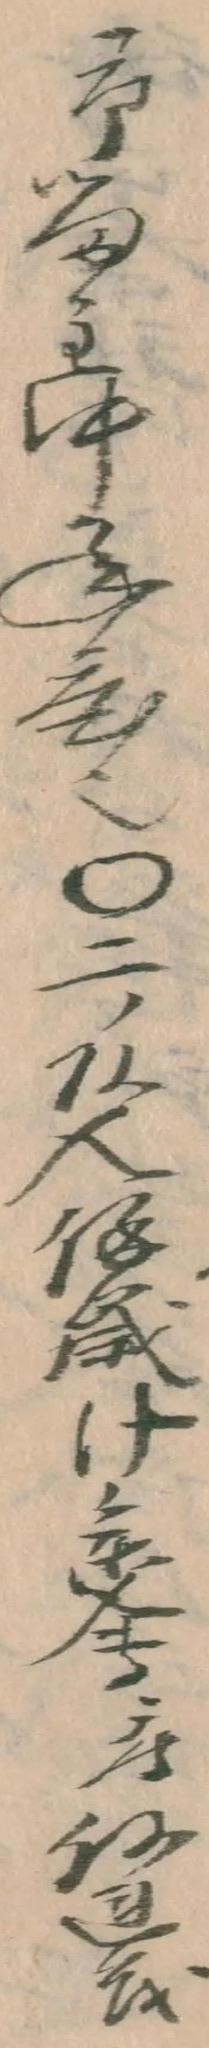予留主中承置也○二ノ頭人歳汁参會ニ付何れも
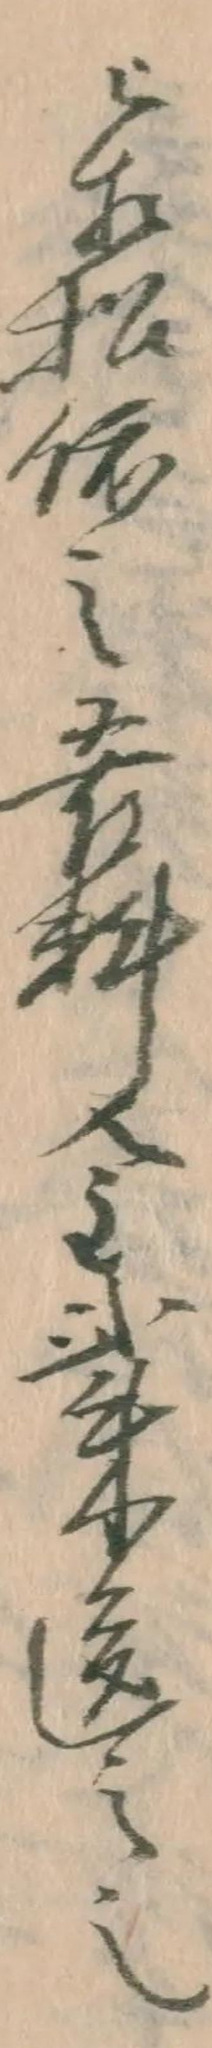被相招依之肴料金弐朱送之也
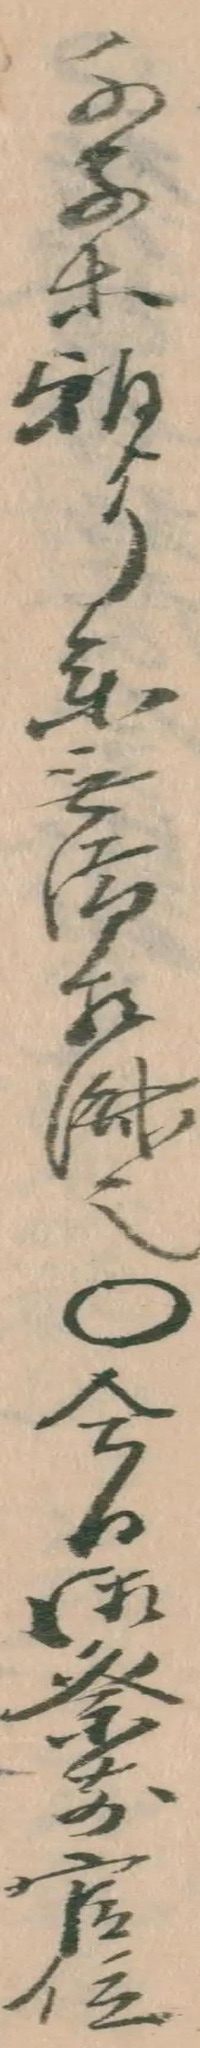千子等朝より参無滞相済也○今日御祭前官位
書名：賀茂社記録. 第67冊
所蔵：国立国会図書館 National Diet Library, JAPAN
